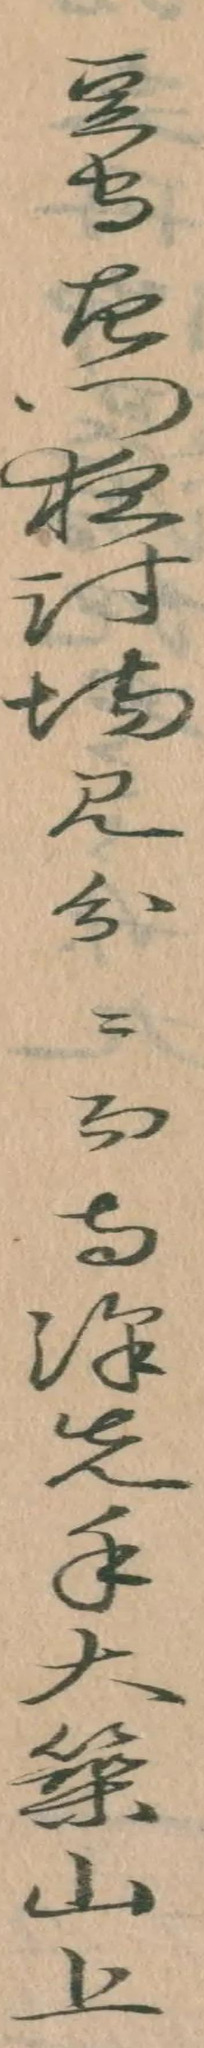豆守左門夜討場見分に而寺沢先手大築山上
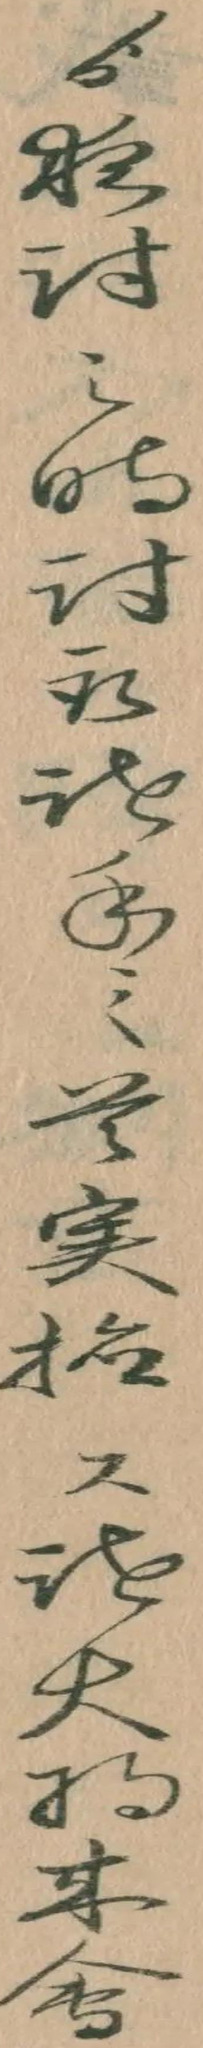ゟ夜討之時討取諸手之首実拾す諸大将来会
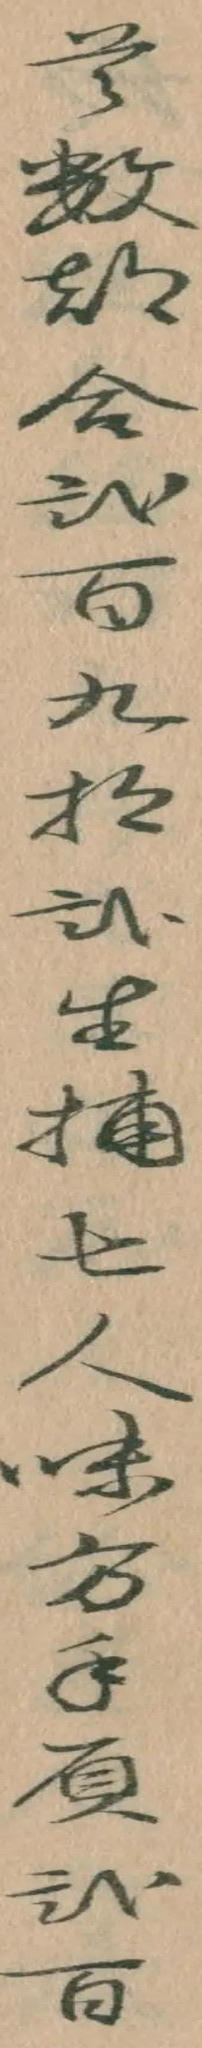首数都合弐百九拾弐生捕七人味方手負弐百
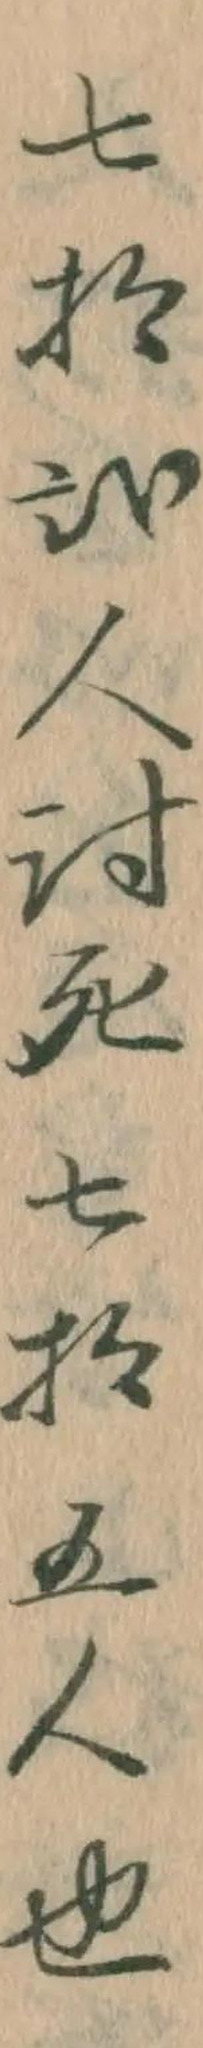七拾弐人討死七拾五人也
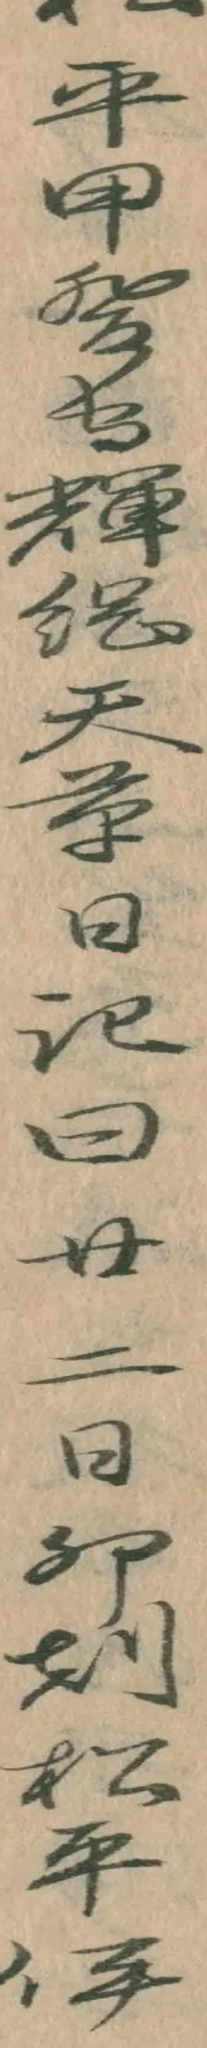松平甲斐守輝綱天草日記曰廿二日夘刻松平伊
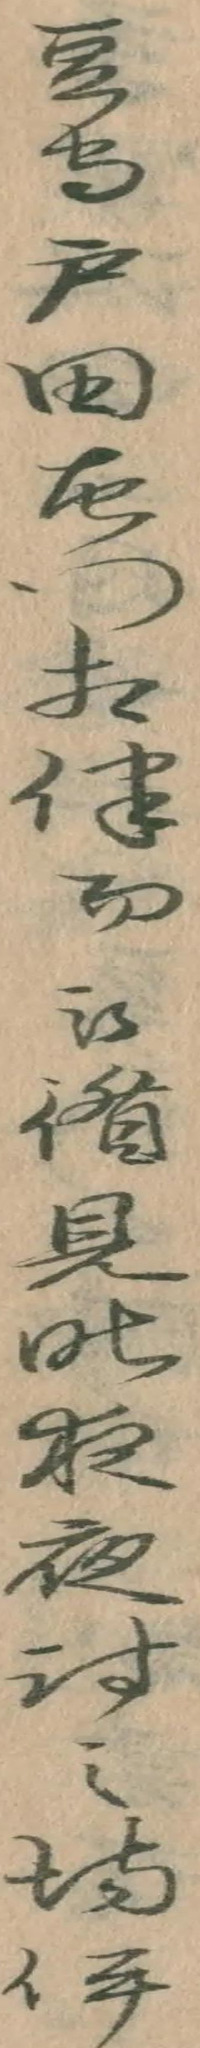豆守戸田左門相伴而被循見昨夜夜討之場伊
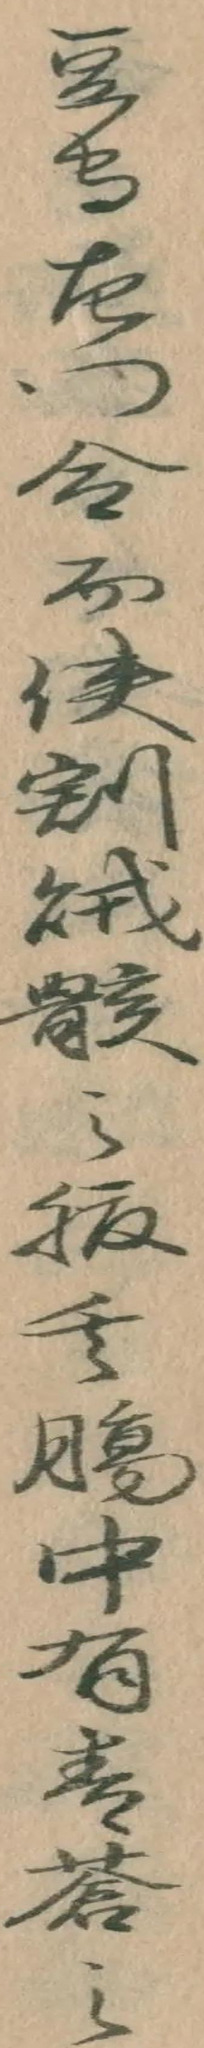豆守左門合辞而使割賊骸之腹其腹中有青蒼
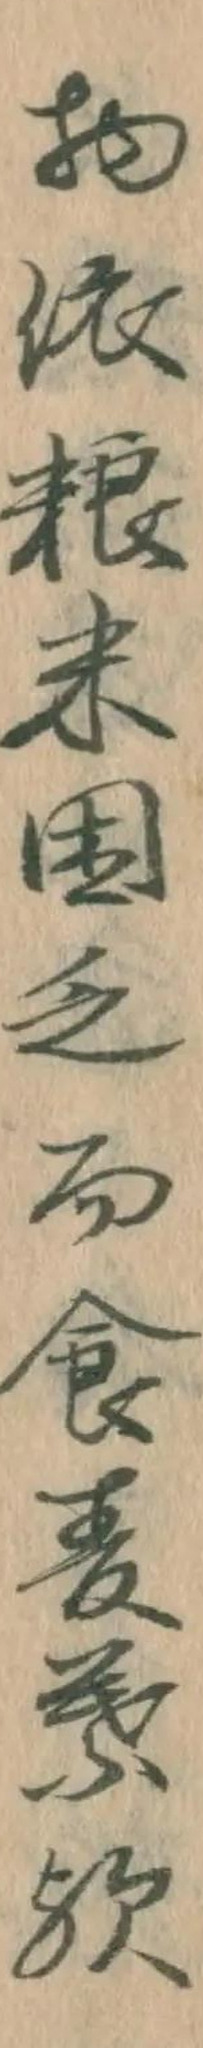物依粮米困乏而食青葉歟
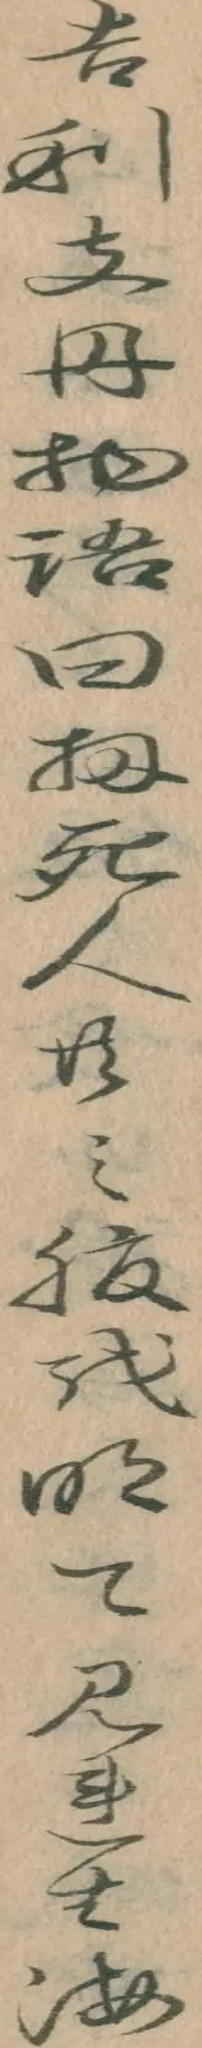吉利支丹物語曰扨死人共之腹越明て見連者海
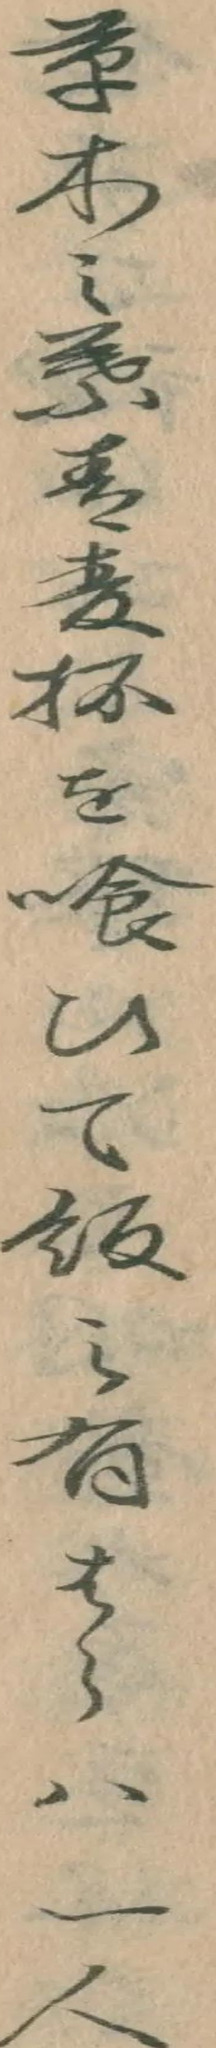草木之葉青麦抔を喰ひて飯之有者しは一人
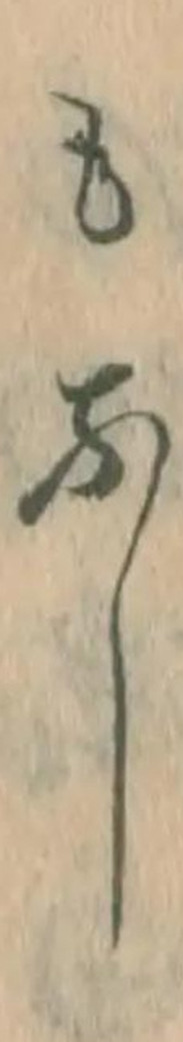もなし

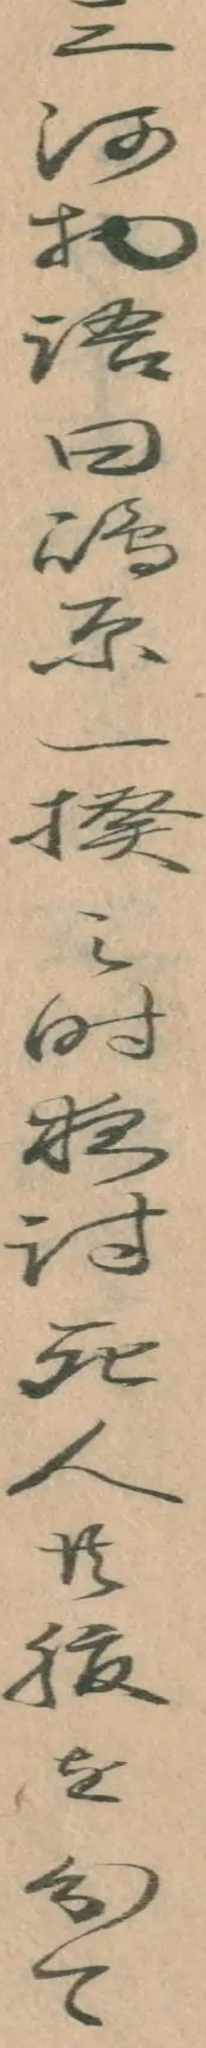三河物語曰島原一揆之時夜討死人共腹を分て
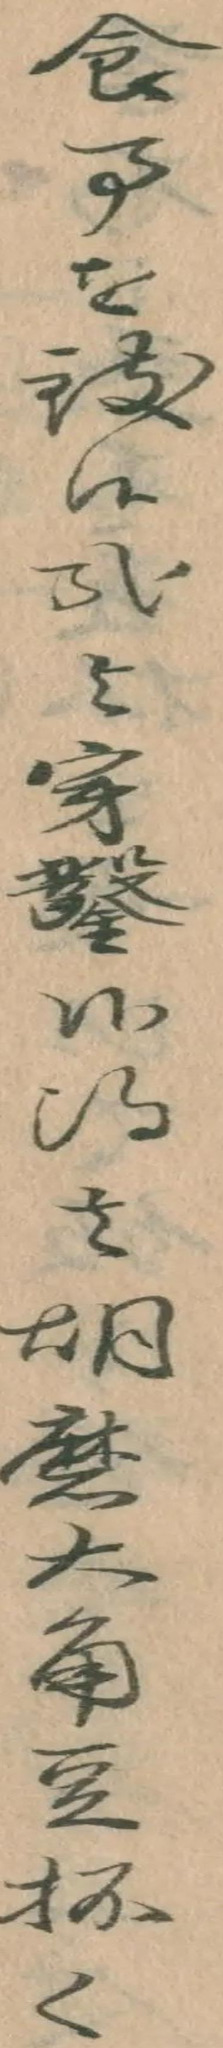食事を致候哉与穿鑿候得者胡磨大角豆抔く
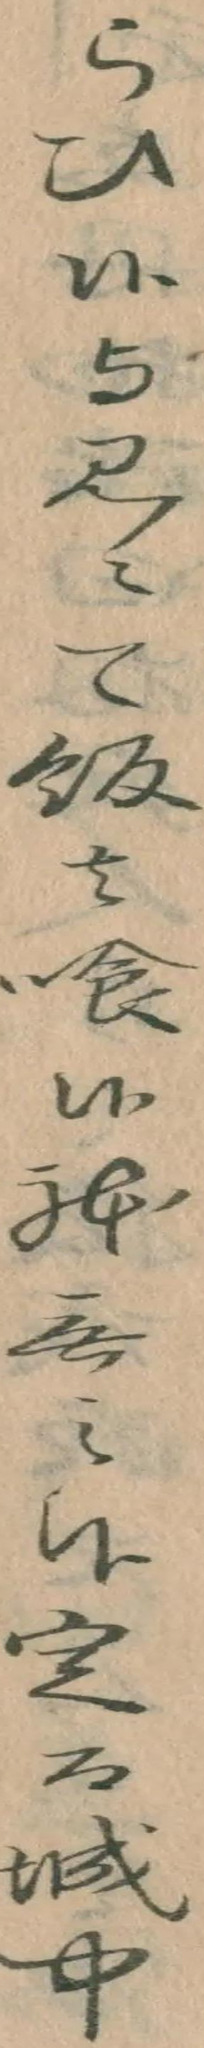らひ候与見にて飯者喰候躰無之候定而城中
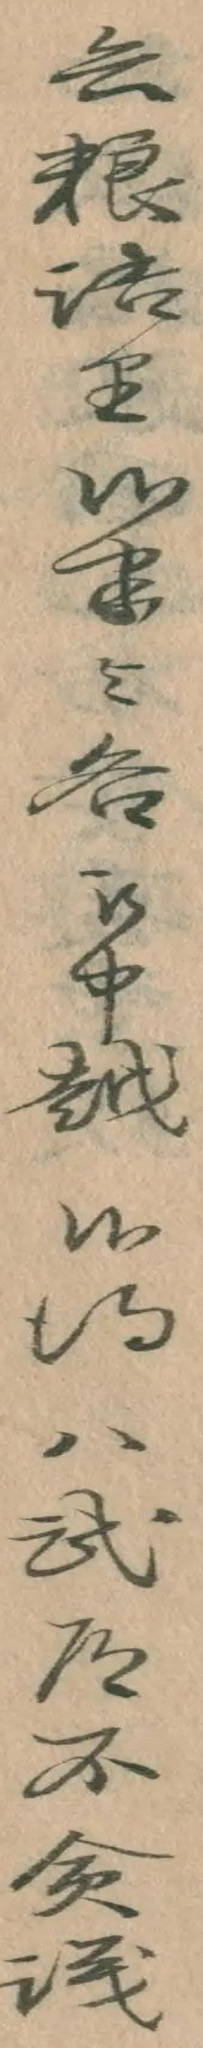兵粮詰里候半与各被申越候得は武道不僉議
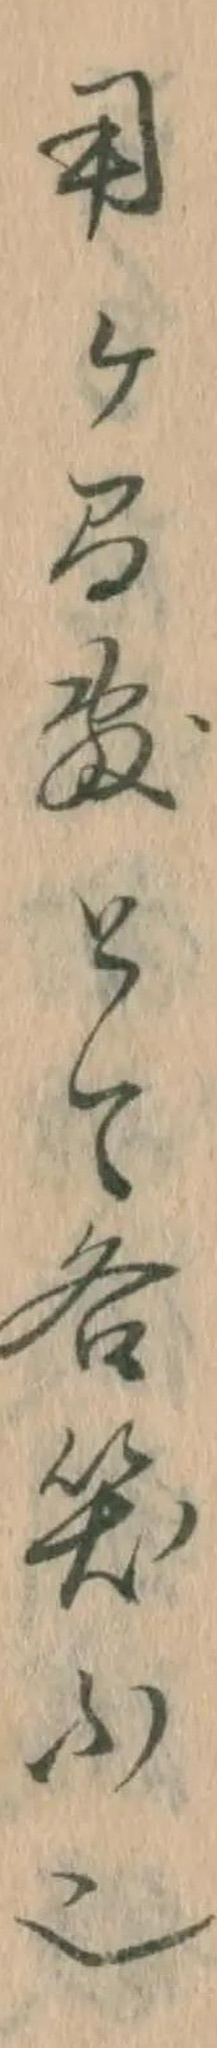用け間敷とて各笑ふ也
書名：切支丹御退治記 49巻. [7]
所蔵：国立国会図書館 National Diet Library, JAPAN
